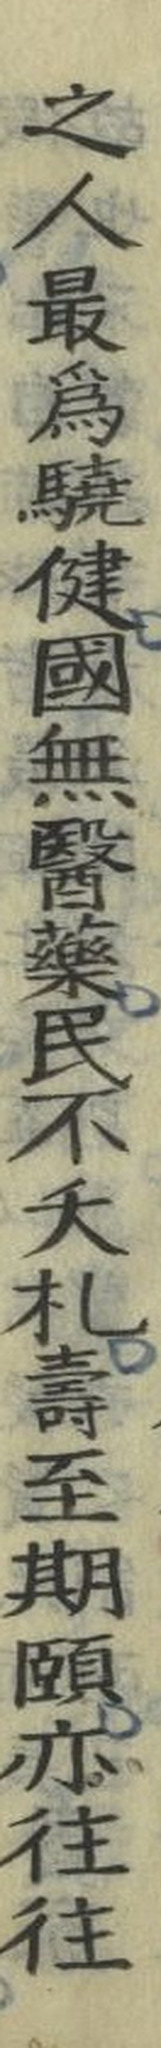之人最爲驍健。國無醫藥。民不夭札。壽至期頤。亦往往
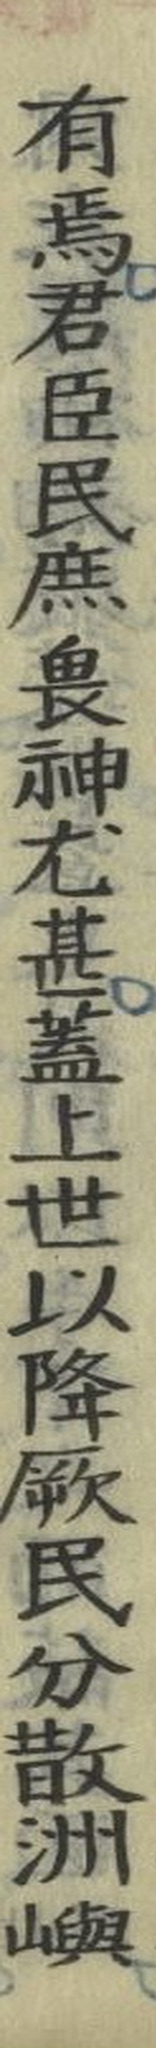有焉。君臣民庶畏神尤甚。蓋上世以降厥民分散洲嶼。
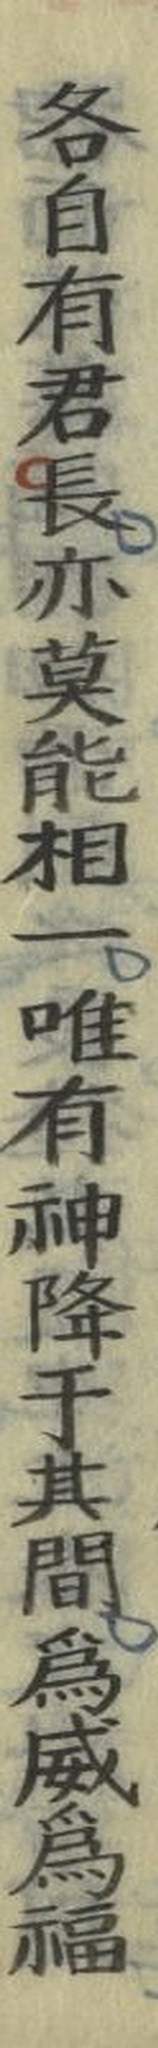各自有君長。亦莫能相一。唯有神降于其間。爲威爲
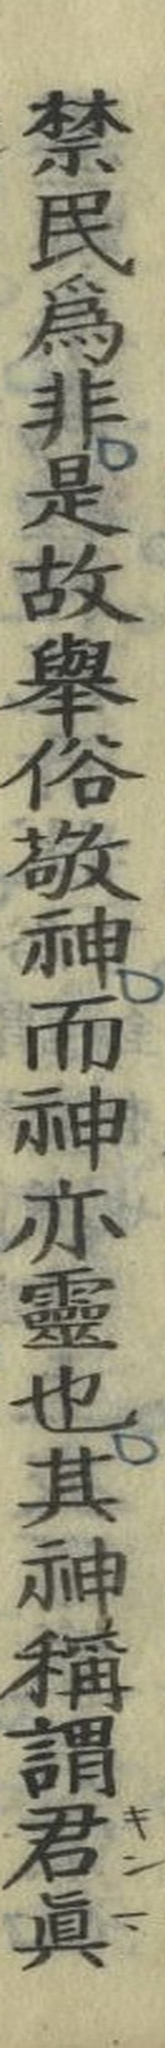禁民爲非。是故舉俗敬神。而神亦靈也。其神稱謂君眞
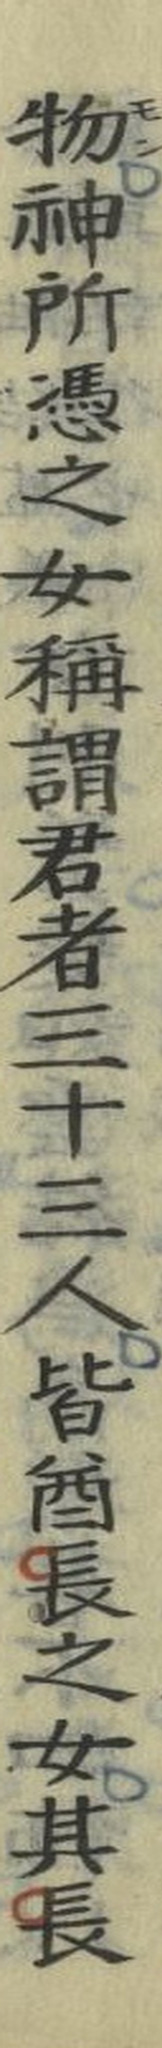物。神所憑之女稱謂君者三十三人。皆酋長之女。其長
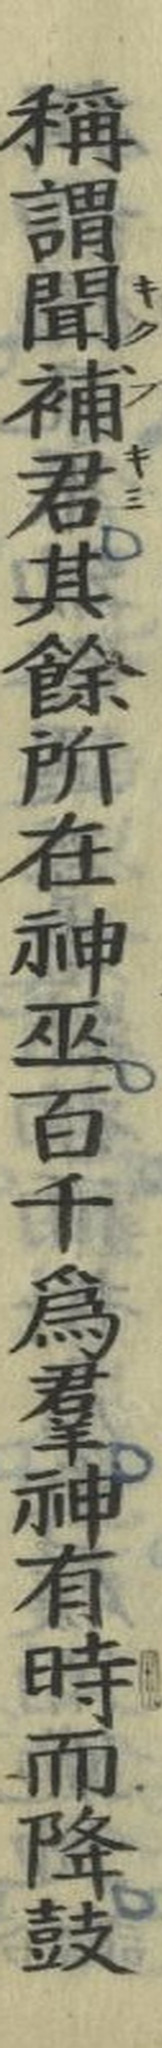稱謂聞補君。其餘所在神巫。百千爲羣。神有時而降。鼓
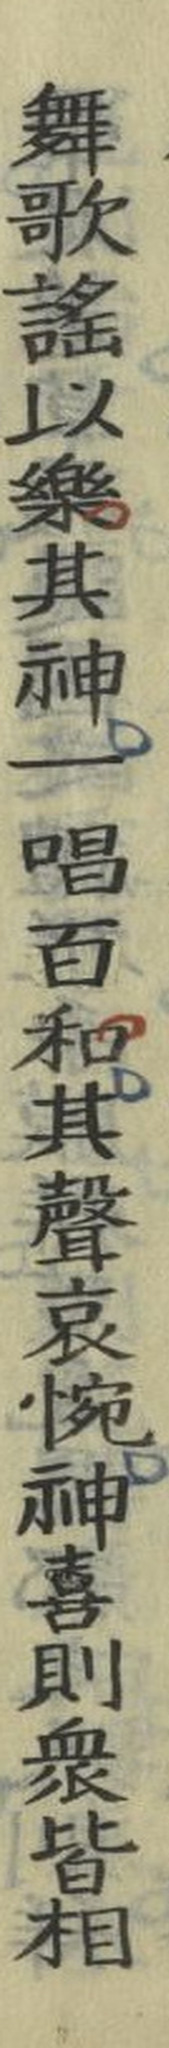舞歌謠以樂其神。一唱百和。其聲哀惋。神喜則衆皆相
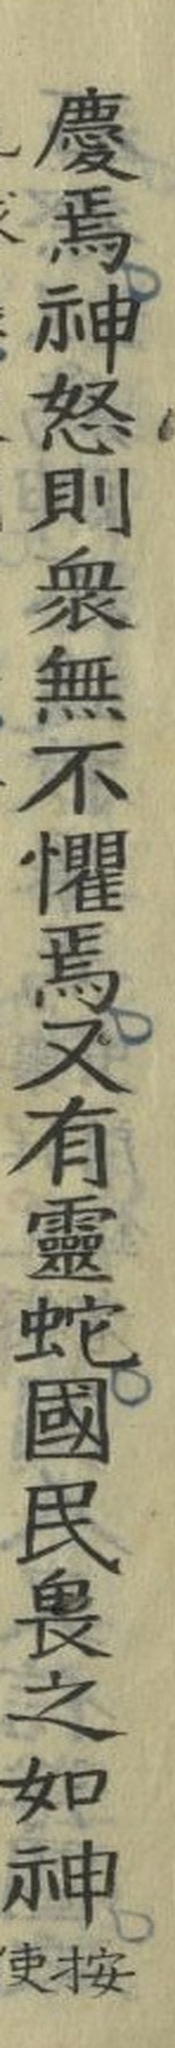慶焉。神怒則衆無不懼焉。又有靈蛇。國民畏之如神

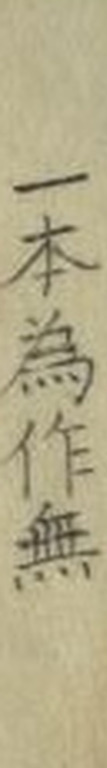一本爲作無
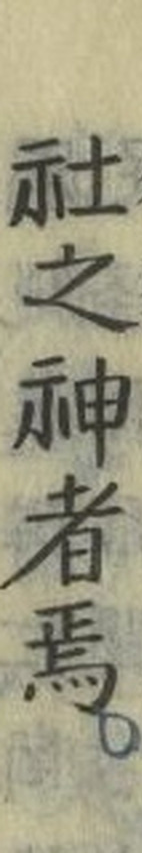社之神者焉。
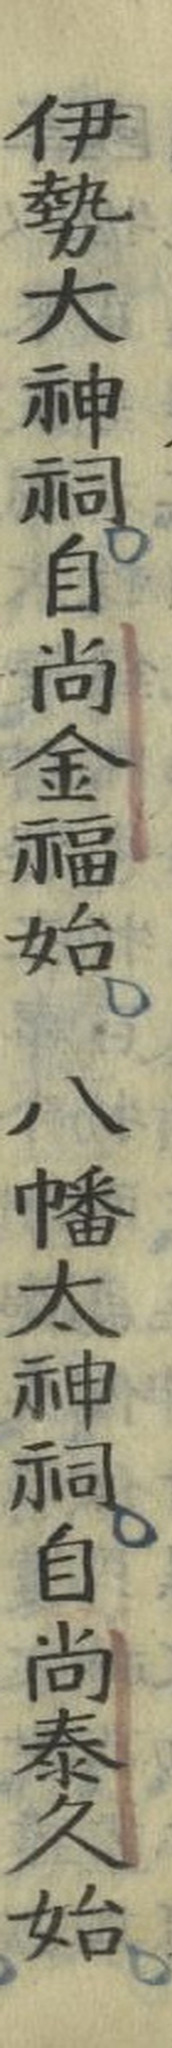伊勢大神祠。自尚金福始。八幡太神祠。自尚泰久始。
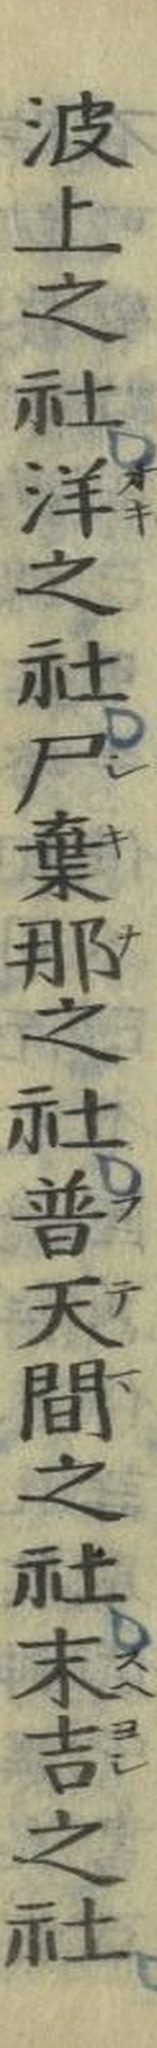波上之社。洋之社。尸棄那之社。普天間之社。末吉之社。
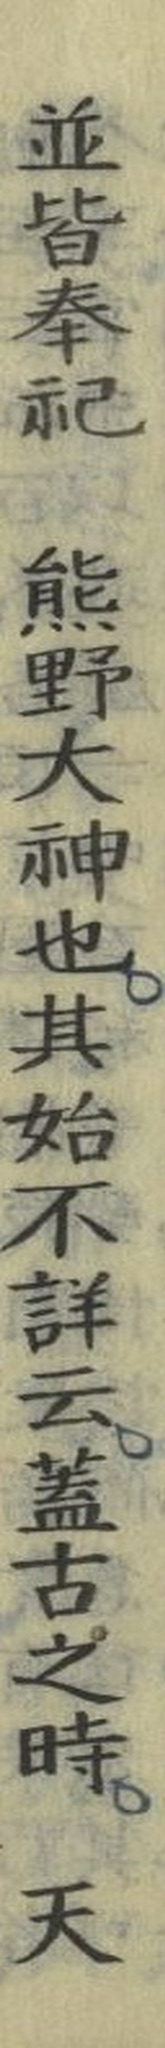並皆奉祀熊野大神也。其始不詳云。蓋古之時。天
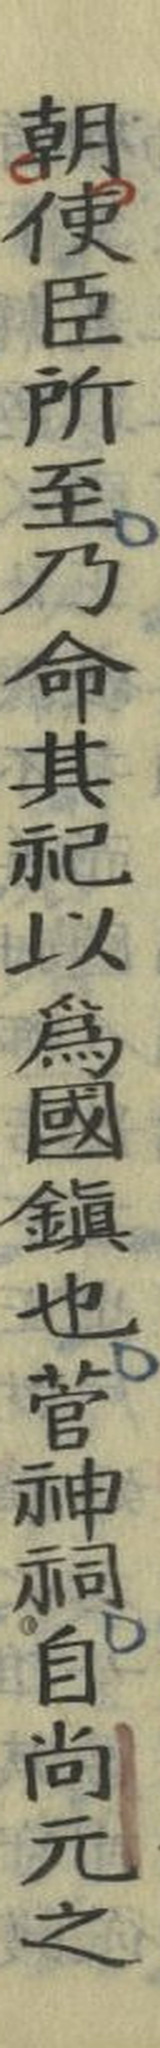朝使臣所至。乃命其祀以爲國鎭也。菅神祠。自尚元之
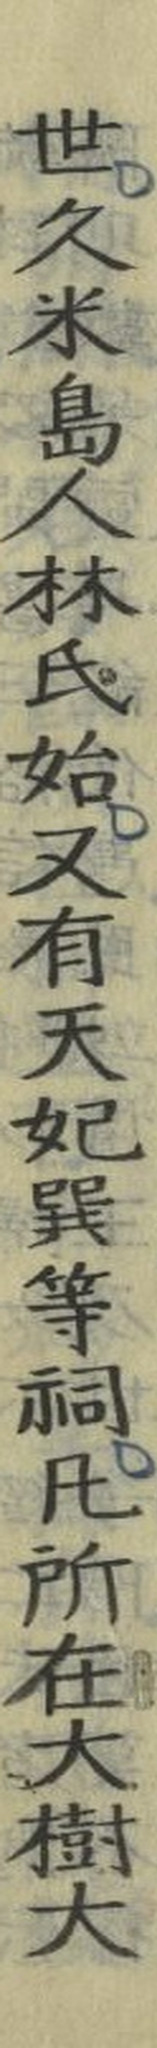世。久米島人林氏始。又有天妃巽等祠。凡所在大樹大
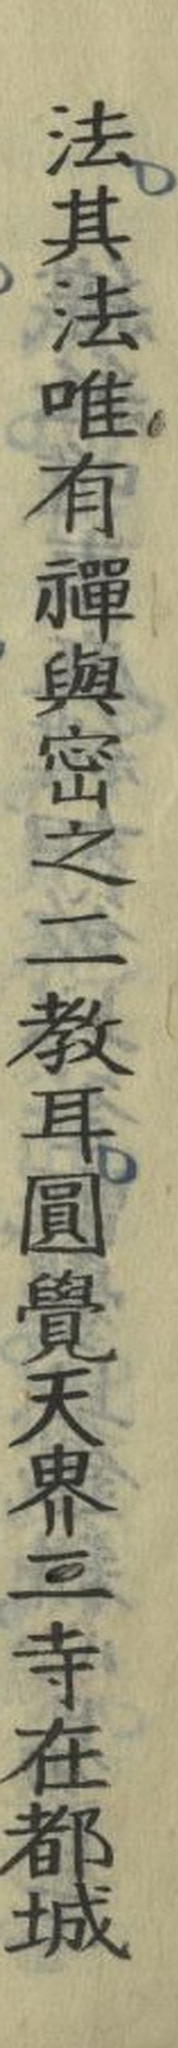法。其法唯有禪與密之二教耳。圓覺天界二寺在都城
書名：南島志
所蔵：University of the Ryukyus Library
